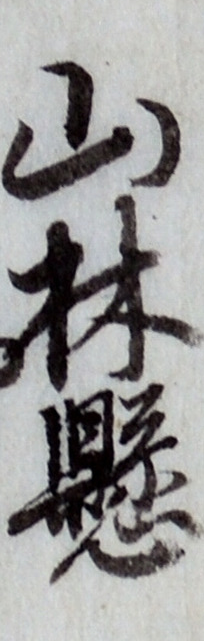山林県
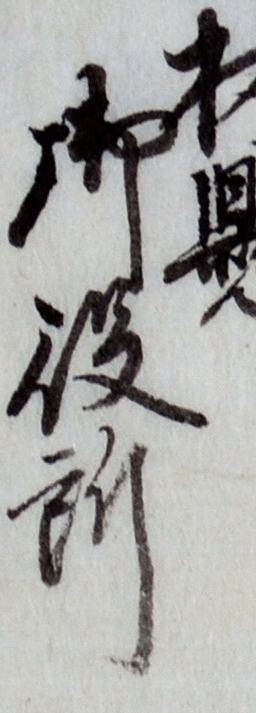御役所

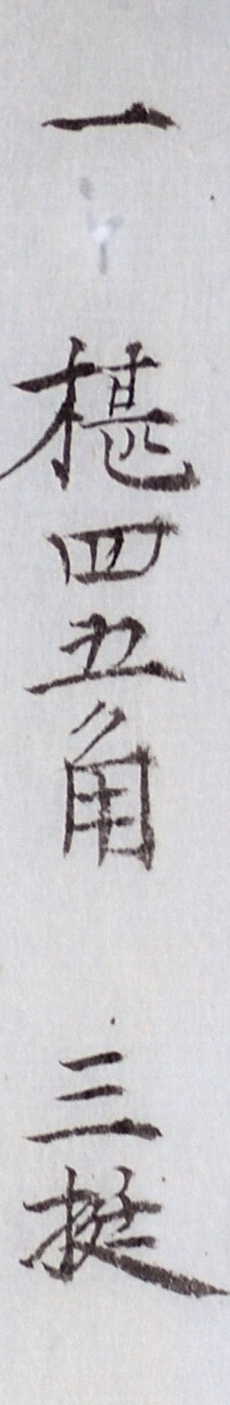一椹四五角三挺同
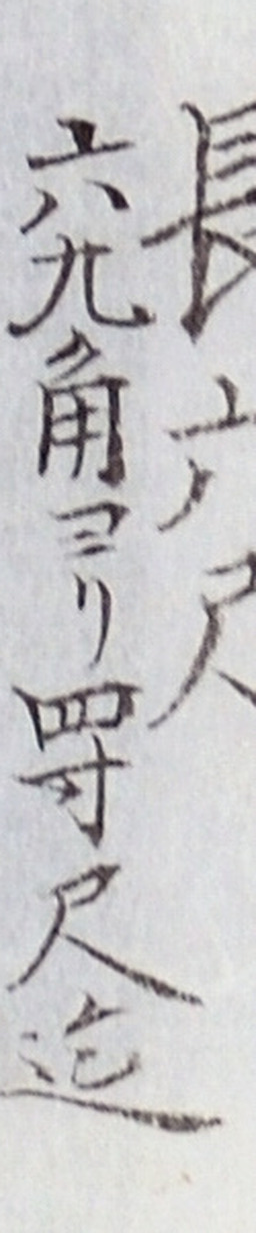六九角ヨリ四寸尺迄
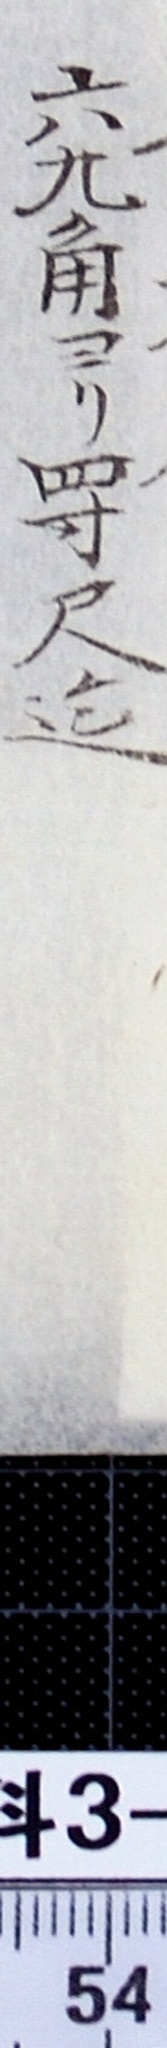六九角ヨリ四寸尺迄
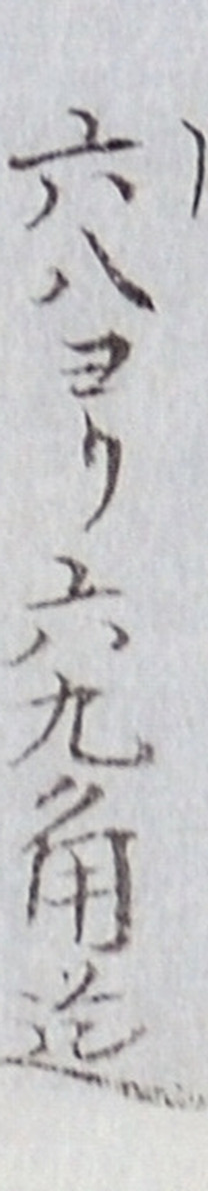六八ヨリ六九角迄
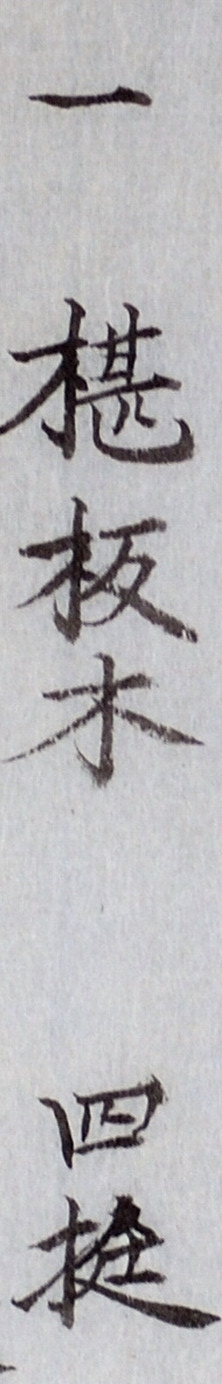一椹板木四挺同
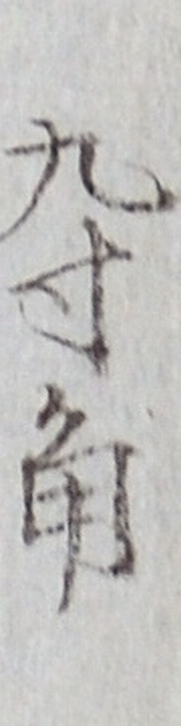九寸角
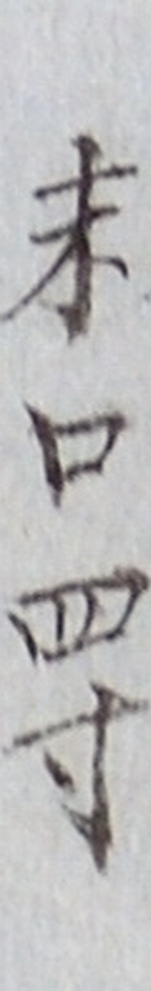末口四寸
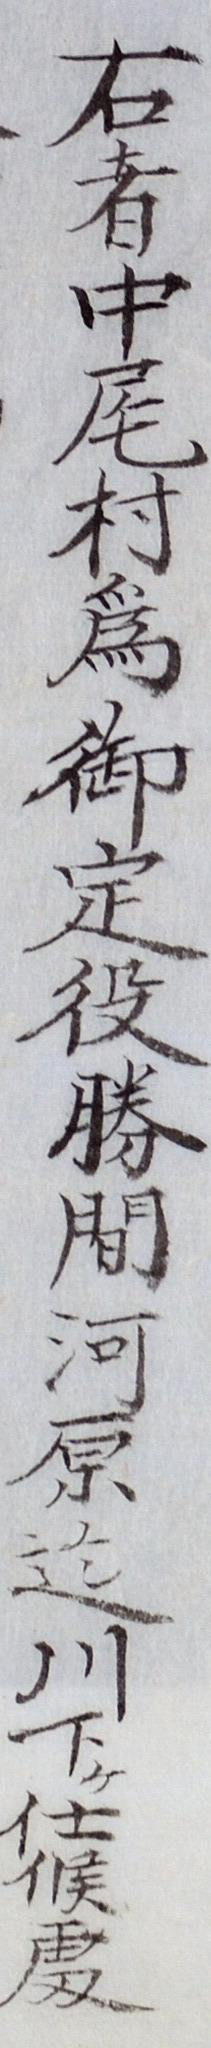右者中尾村為御定役勝間河原迄川下ケ仕候処
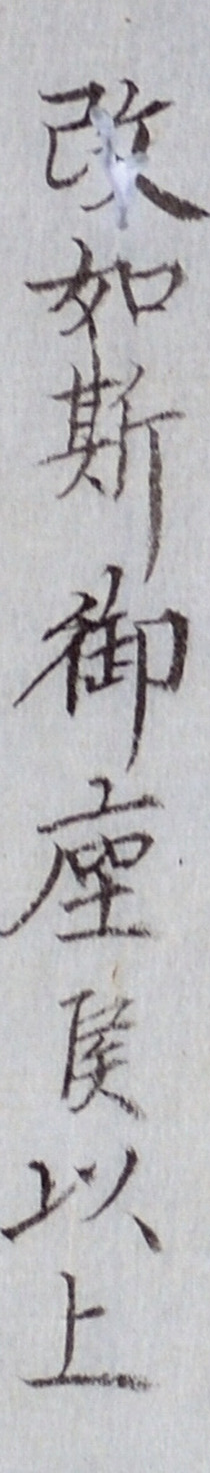改如斯御座候以上
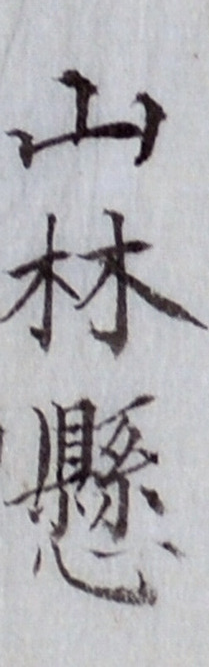山林県
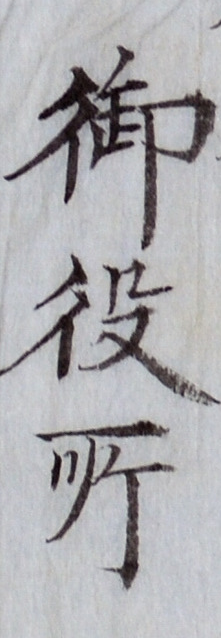御役所
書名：記
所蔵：伊那市立高遠町図書館・合同会社AMANE
